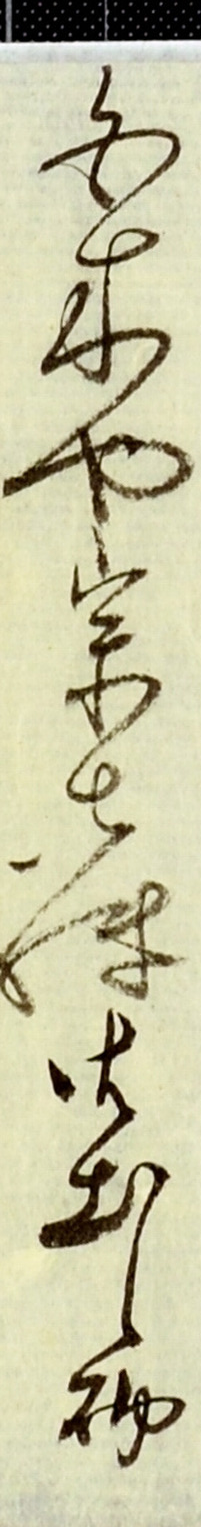白木や宗七様御出候砌
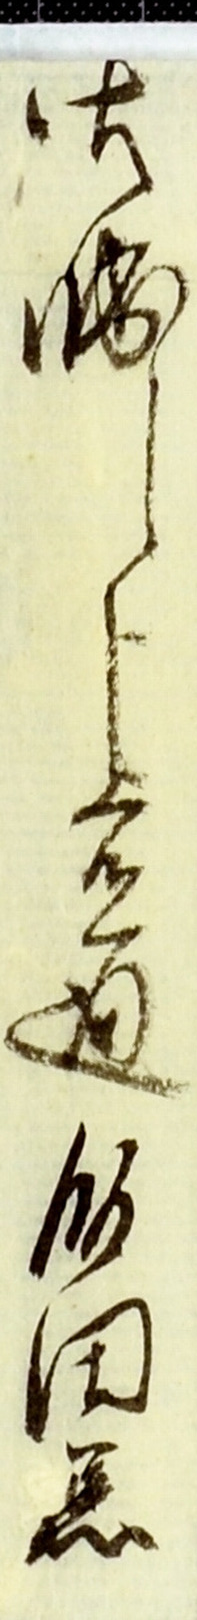御咄し申上候通飯田着
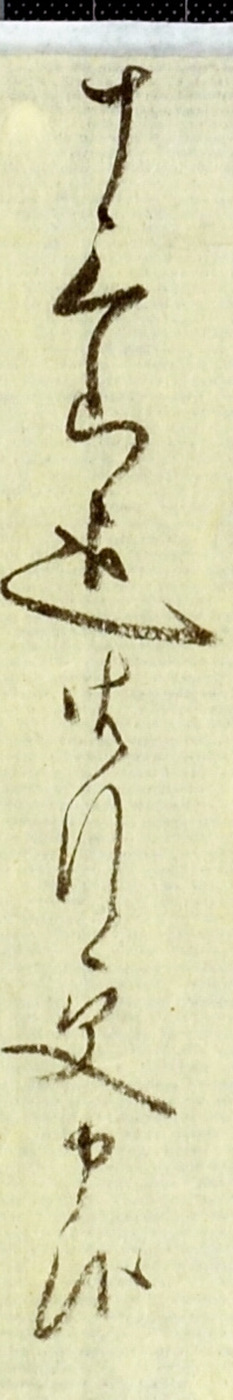十三匁迄御引受申候
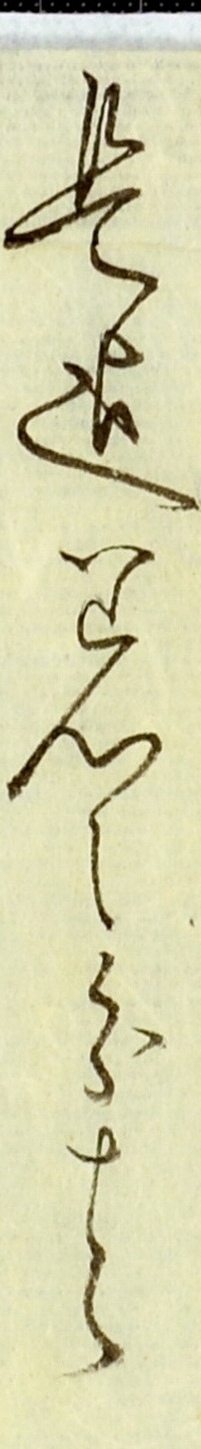是迄着之分は
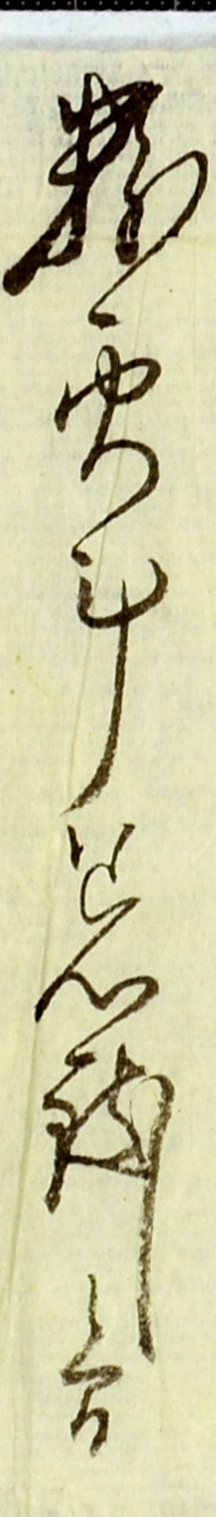粉灰計着致し候間
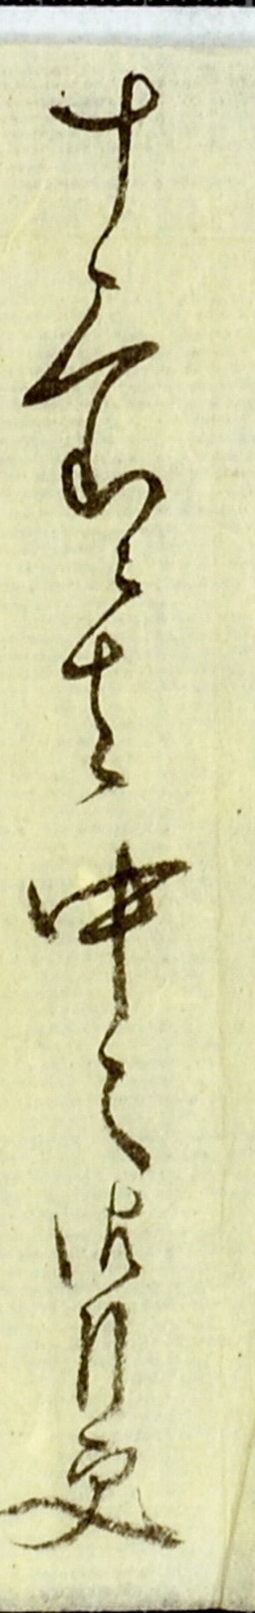十三匁には中々御引受
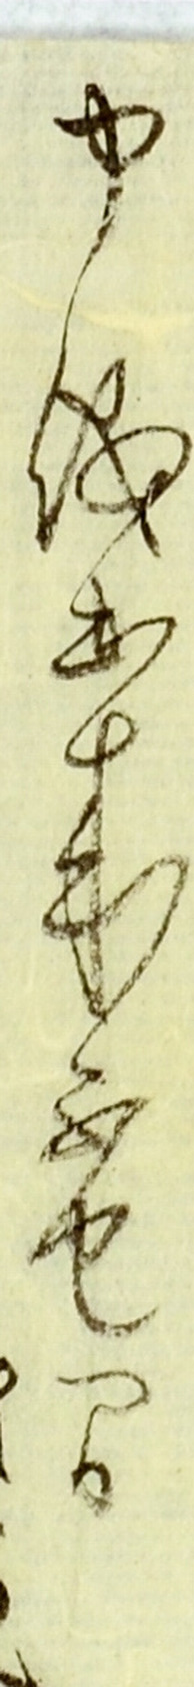申儀出来不申候間
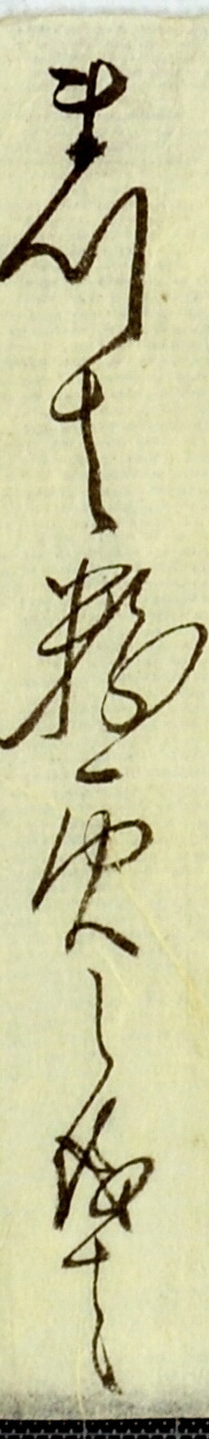まつは粉灰之儀は
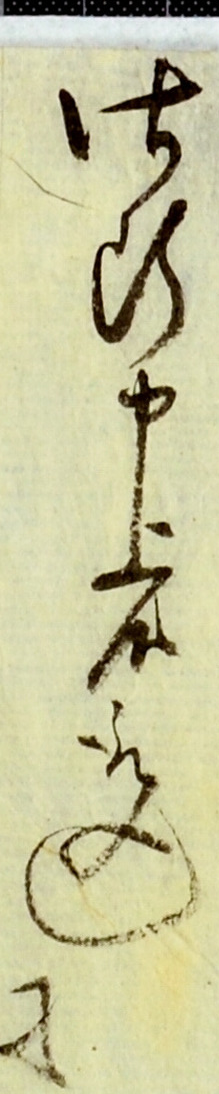御断申上候取込
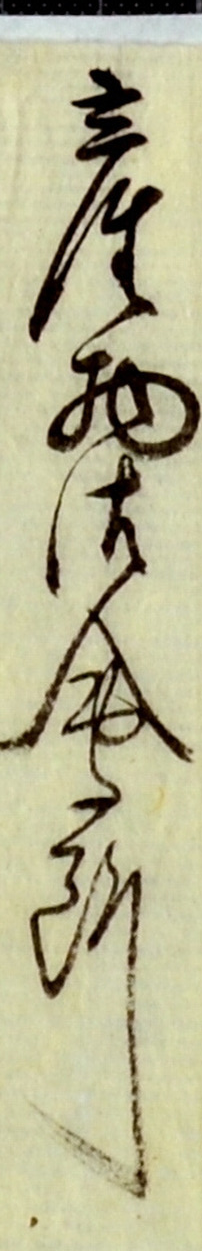産物御会所
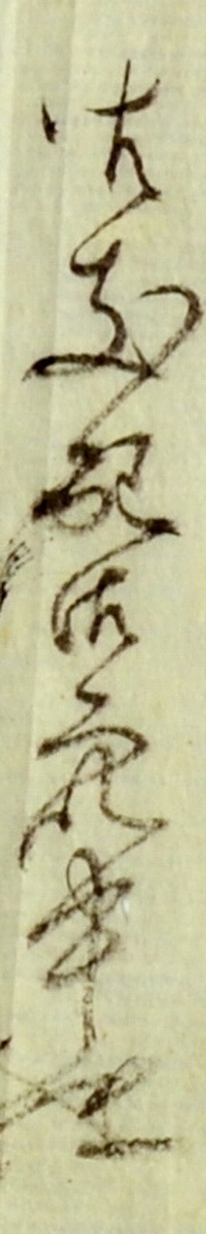御支配御衆中様

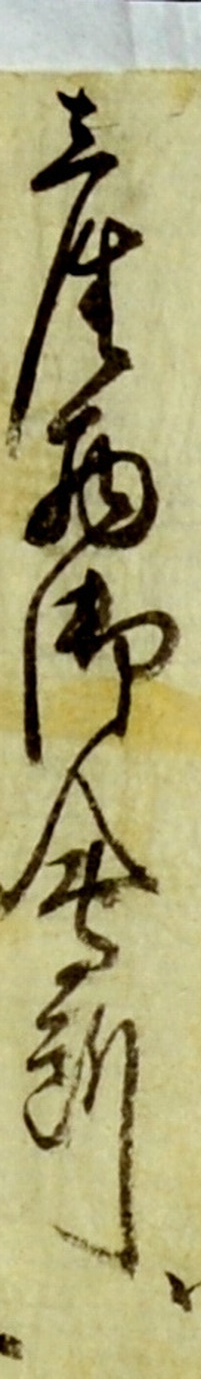産物御会所
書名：書状
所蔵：伊那市立高遠町図書館・合同会社AMANE
